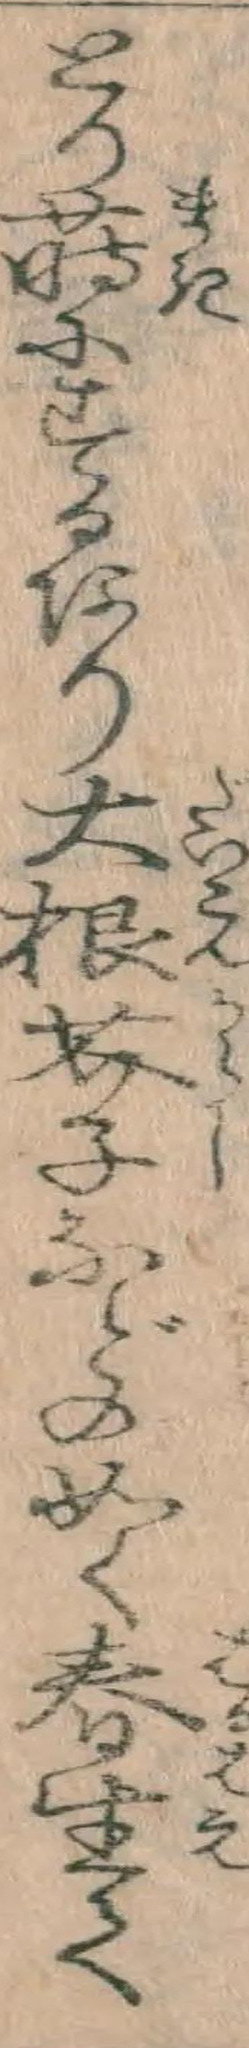とり蒔にするあり大根芥子などの如く春生て
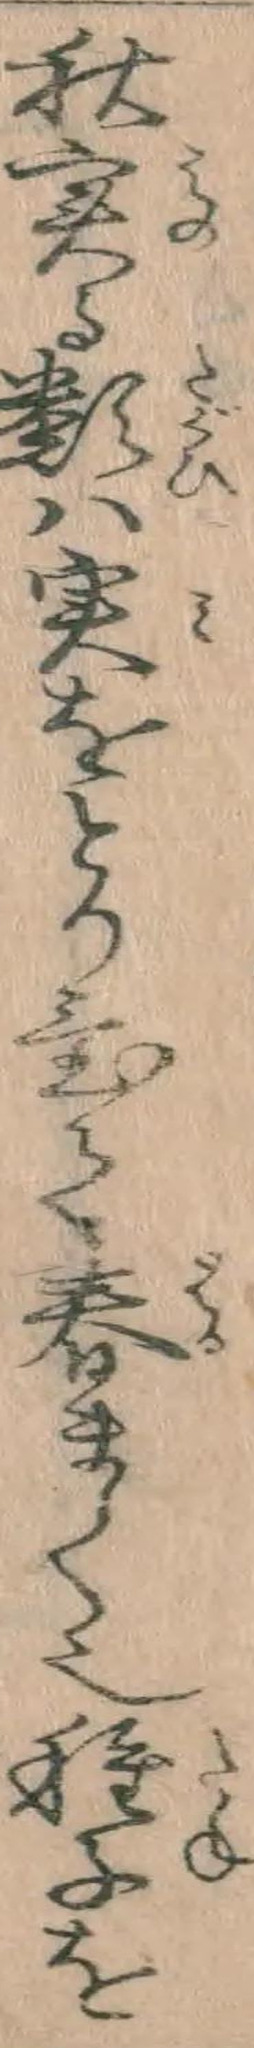秋実る類は実をとり置て春まく也種子を
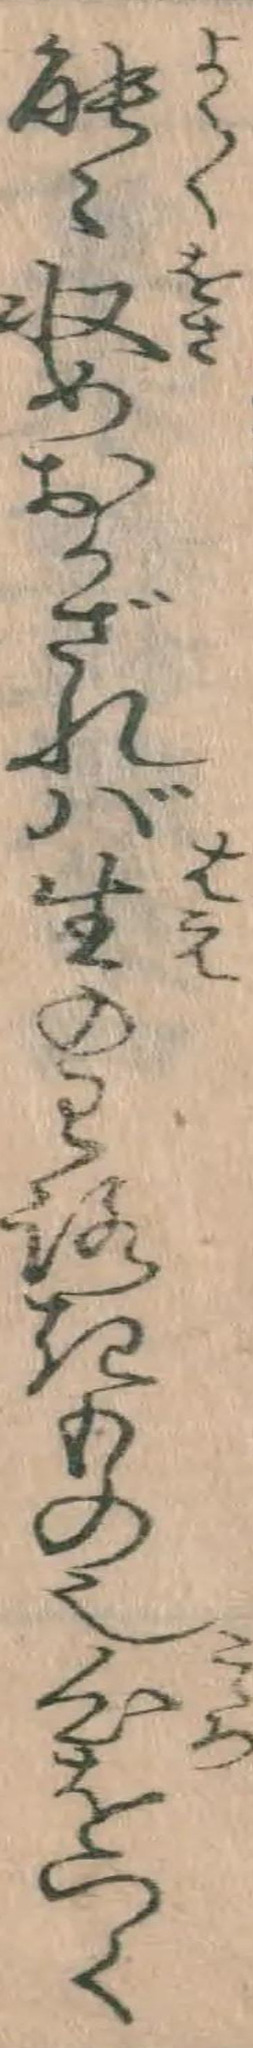能々収めおかざれば生のわろきもの也心をつく
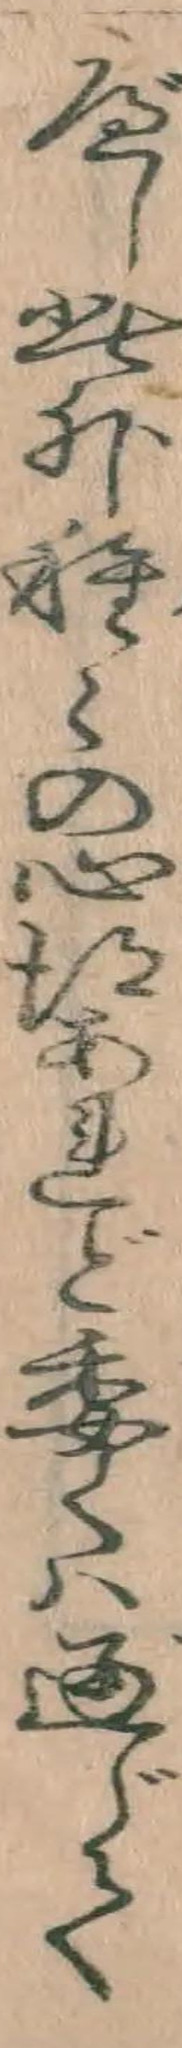べし此外種々の心得あれど委くは通じて
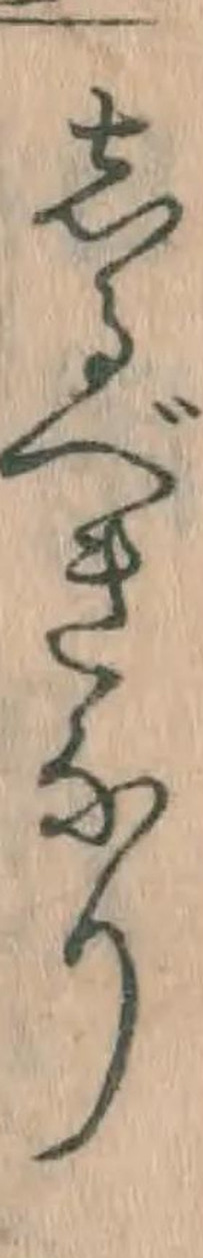しるべきなり
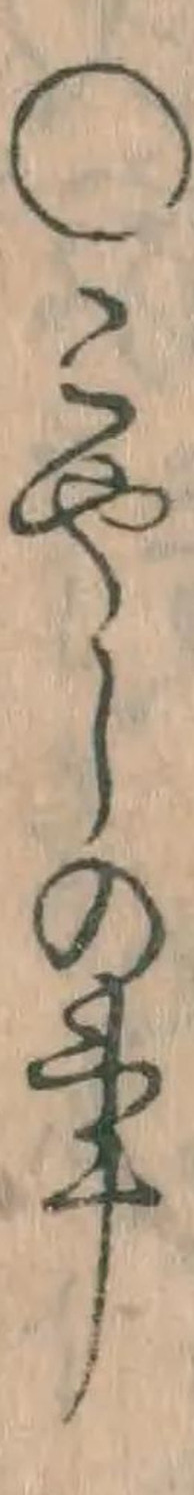○こやしの事
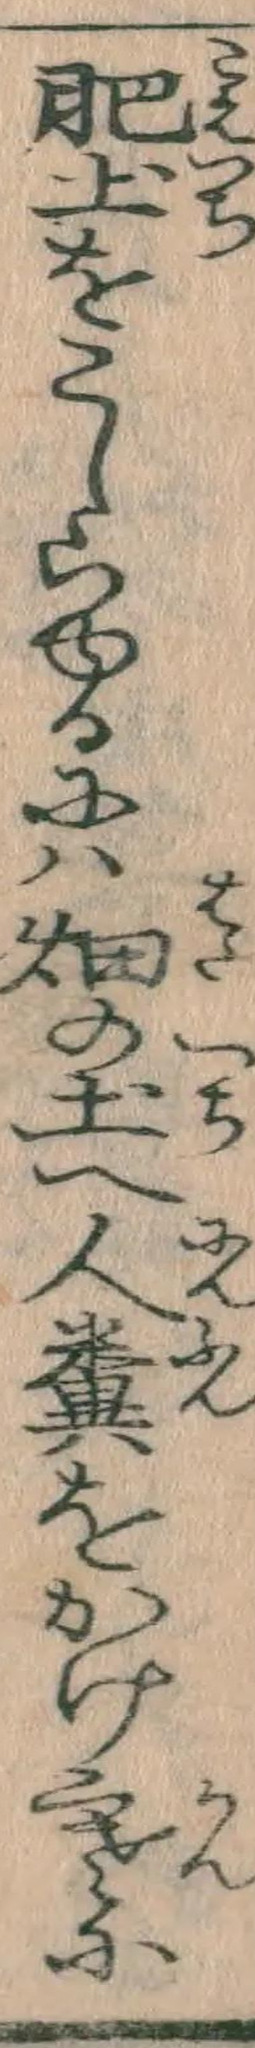肥土をこしらゆるには畑の土へ人糞をかけ寒に
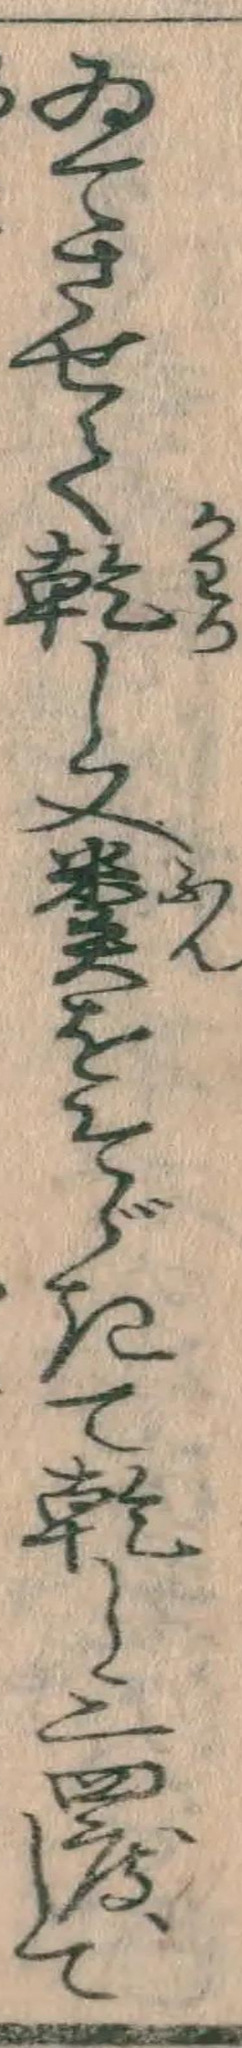ゐてさせて乾し又糞をそゞきて乾し三四度して
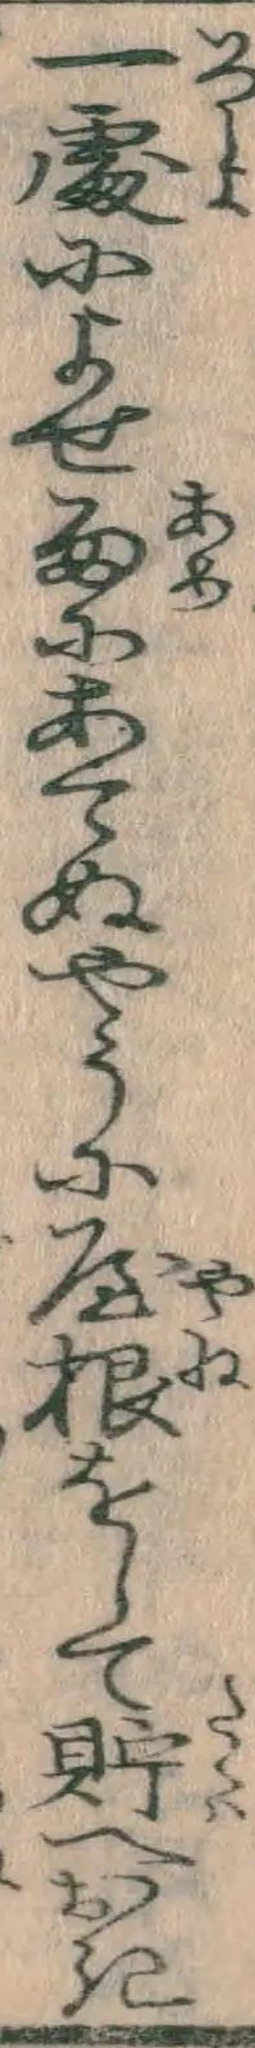一処によせ雨にあてぬやうに屋根をして貯へおき
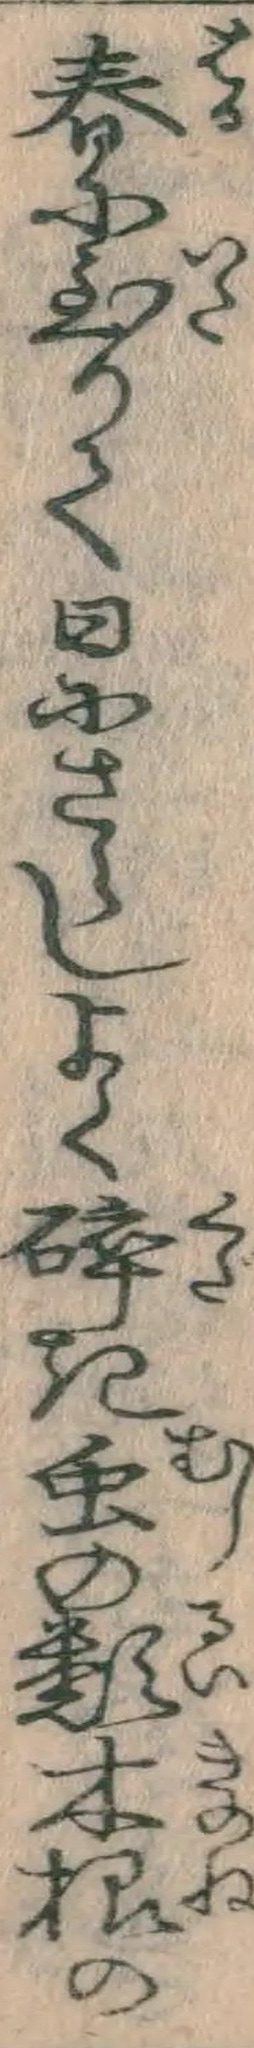春に至りて日にさらしよく砕き虫の類木根の
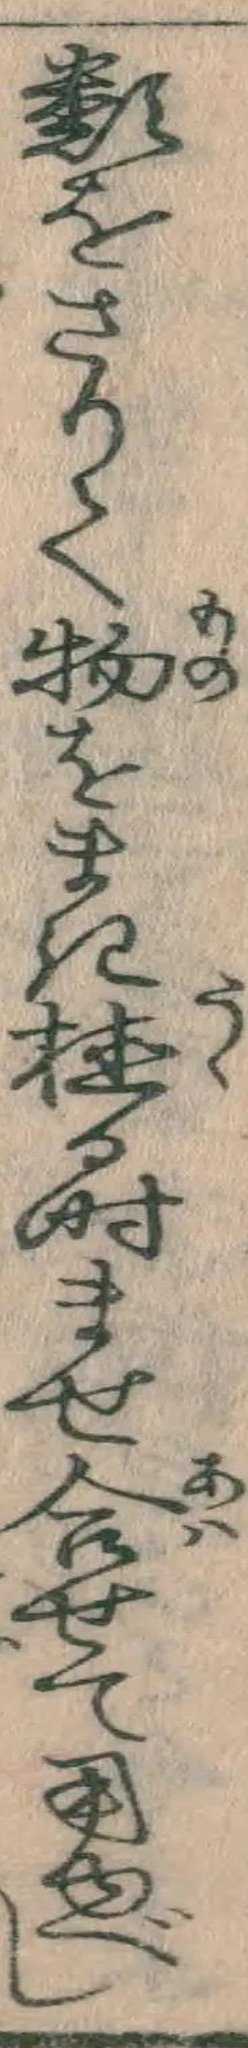類をさりて物をまき植る時ませ合せて用ゆべし
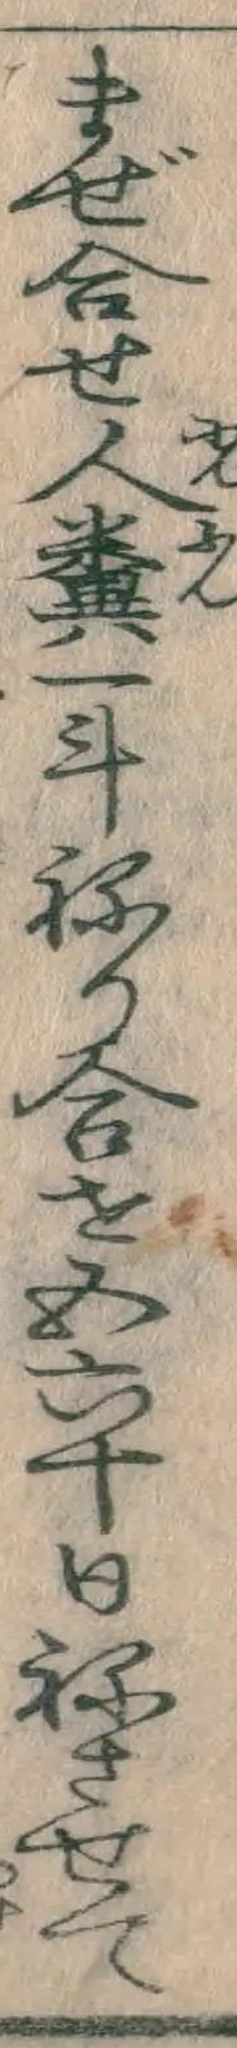まぜ合せ人糞一斗ねり合せ五六十日ねさせて
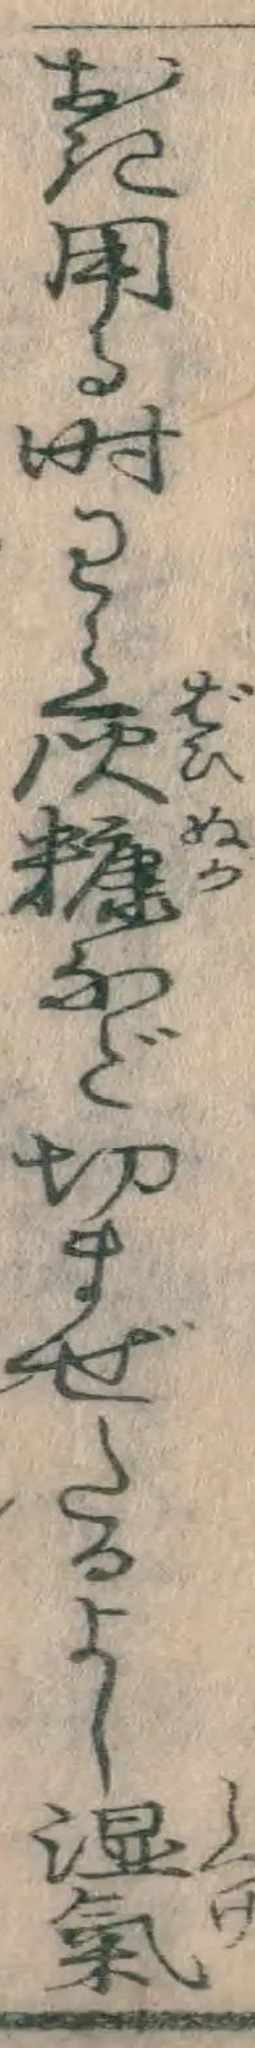おき用る時わら灰糠など切まぜたるよし湿気
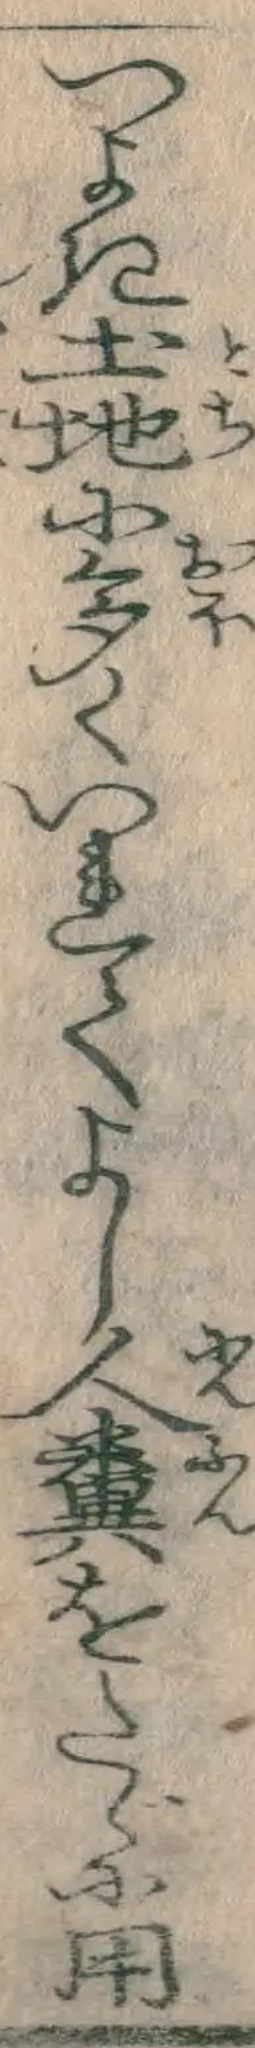つよき土地に多くいれてよし人糞をたゞに用
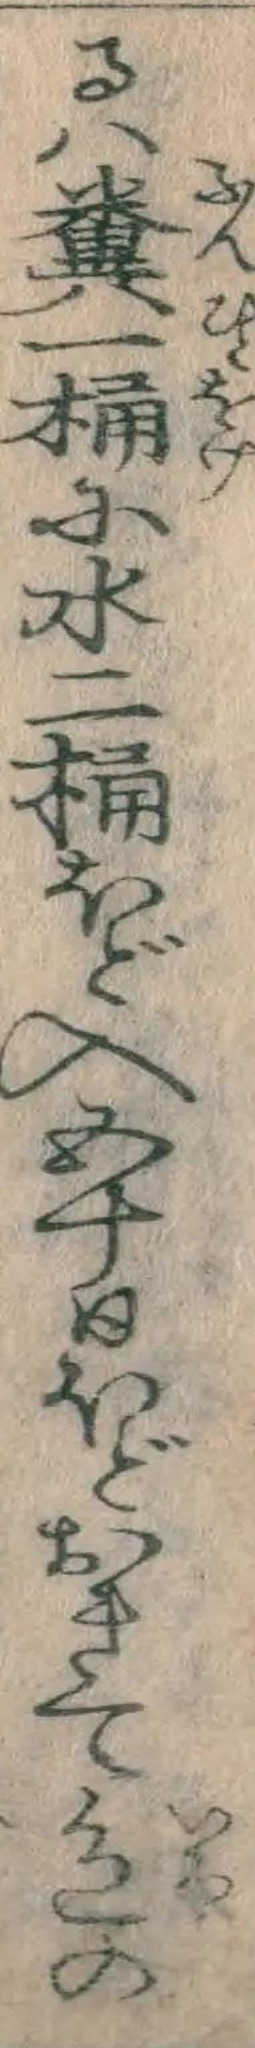るは糞一桶に水二桶ほど入五十日ほどおきて色の
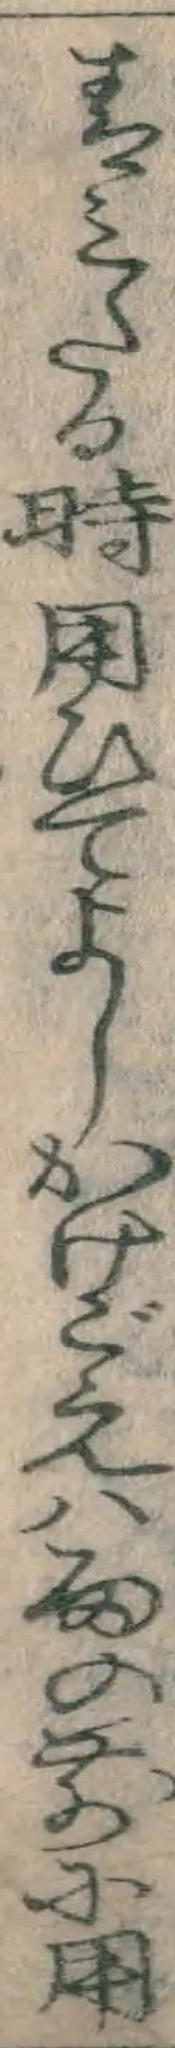青みたる時用ひてよしかけごえは雨の前に用
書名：広益秘事大全 3巻. [5]
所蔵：国立国会図書館 National Diet Library, JAPAN
